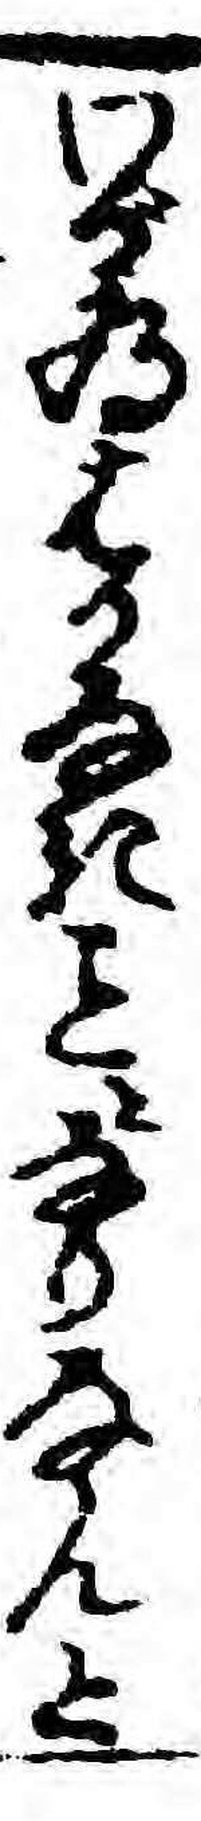わが為はかなきことになりなんと
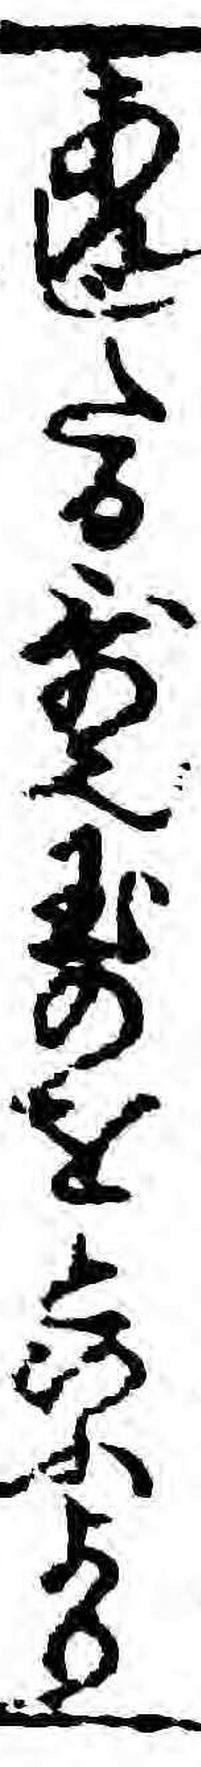あんじたる哥也玉のをといふより
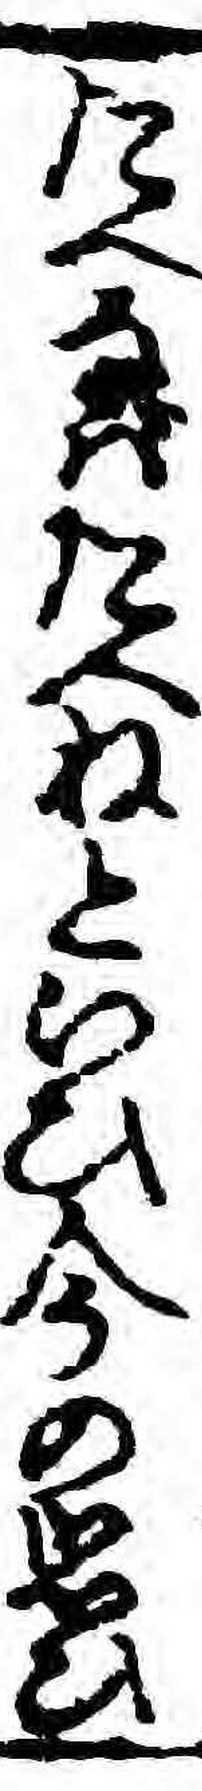たへなばたへねといひ今の思ひ
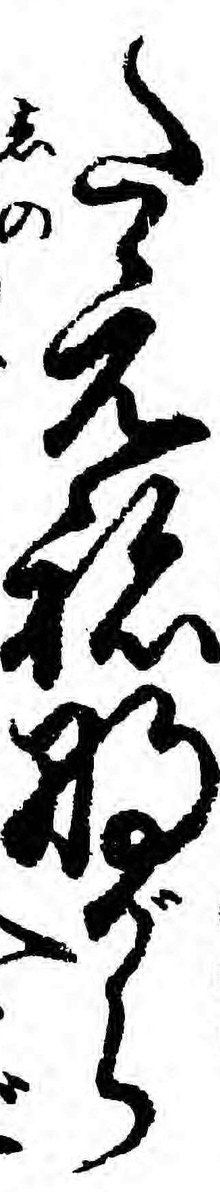たえねながら
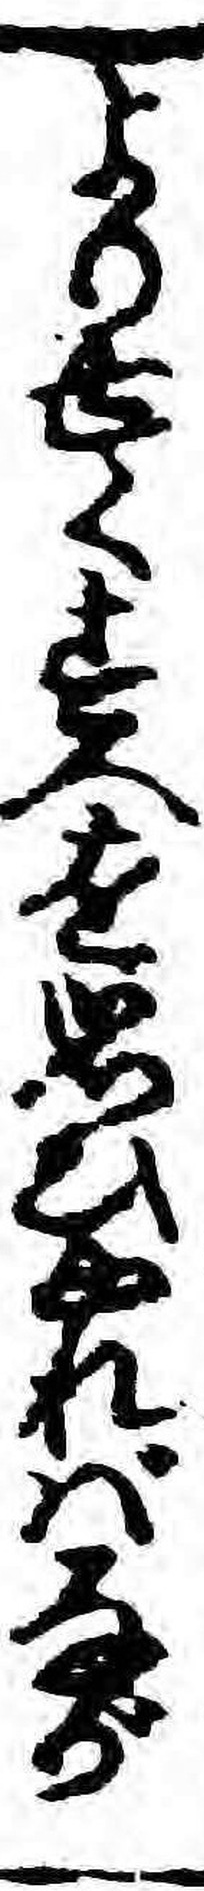よりゆくすへを思ひやればなが
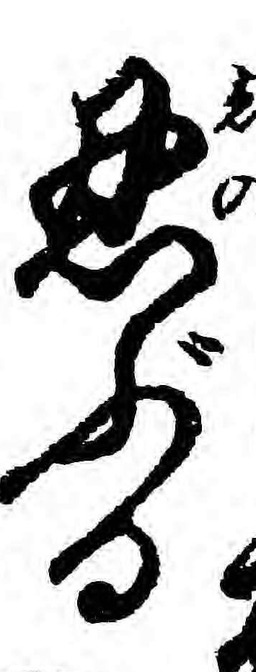忍ぶる
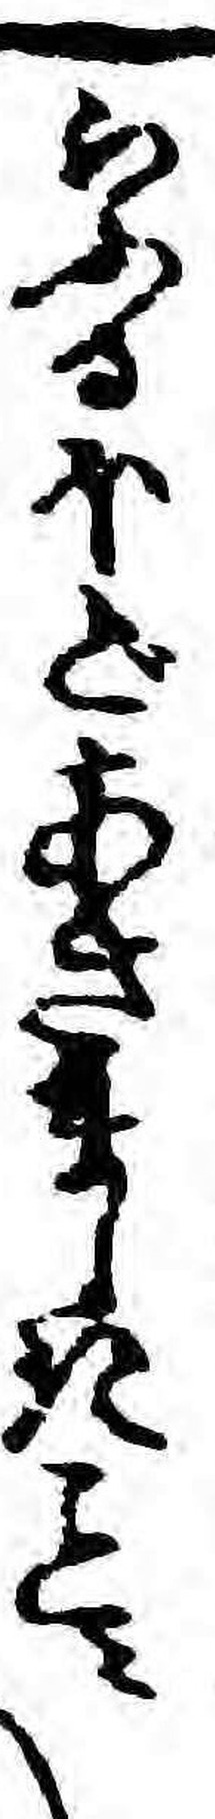らふるほどあさましきことに
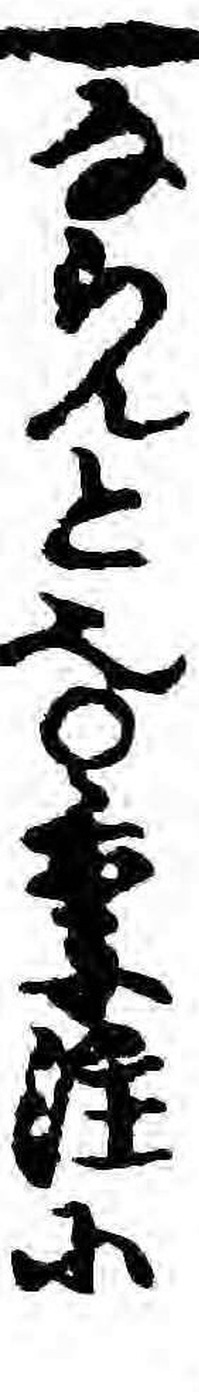ならんと也〇季注に
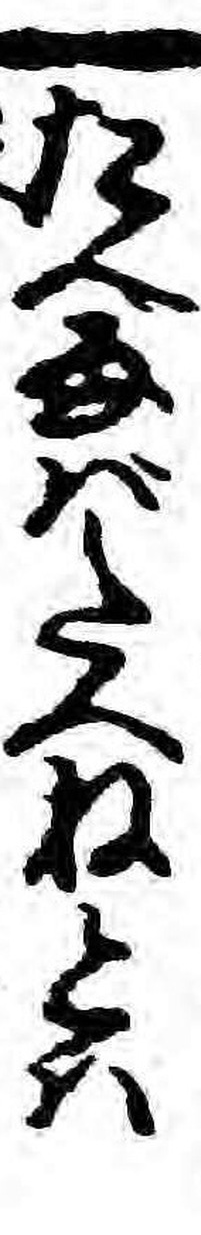たへなばたへねとは
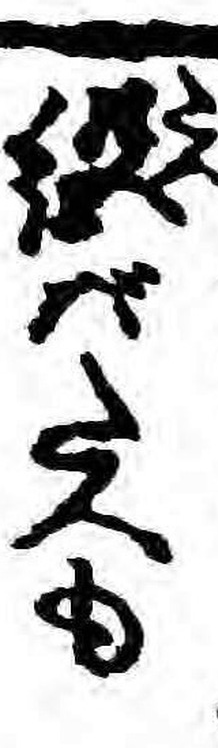絶ばたへも
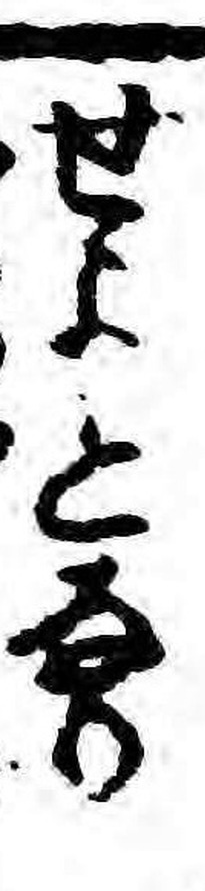せよとなり
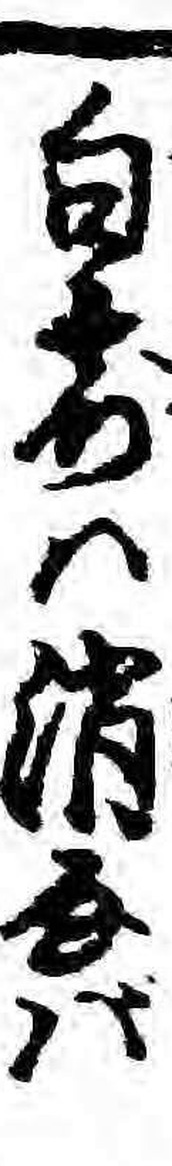白露は消なば
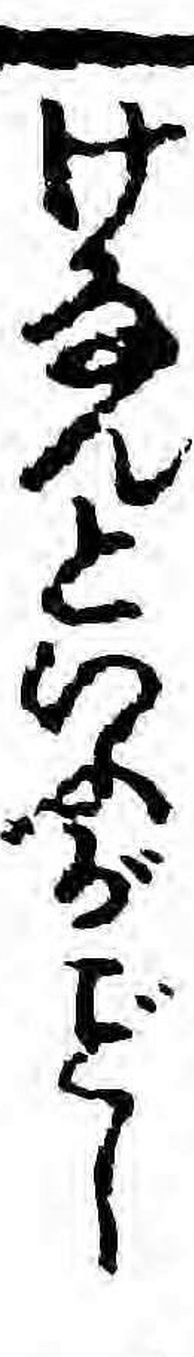けなんといふがごとし
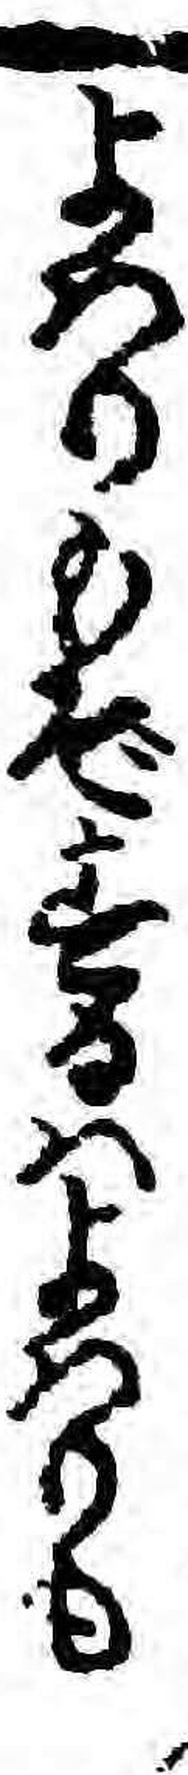よはりもぞするはよはりも
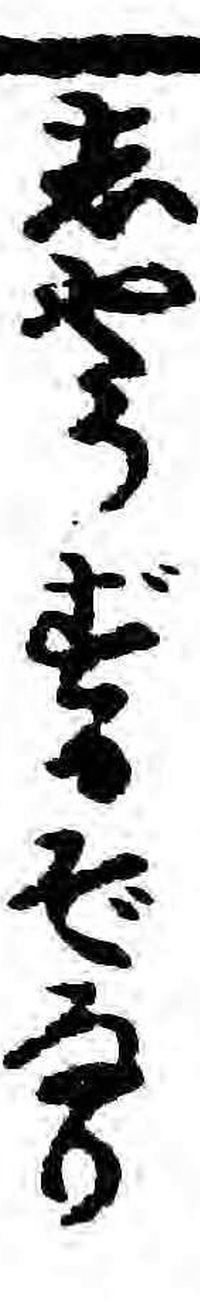しやうずるぞなり

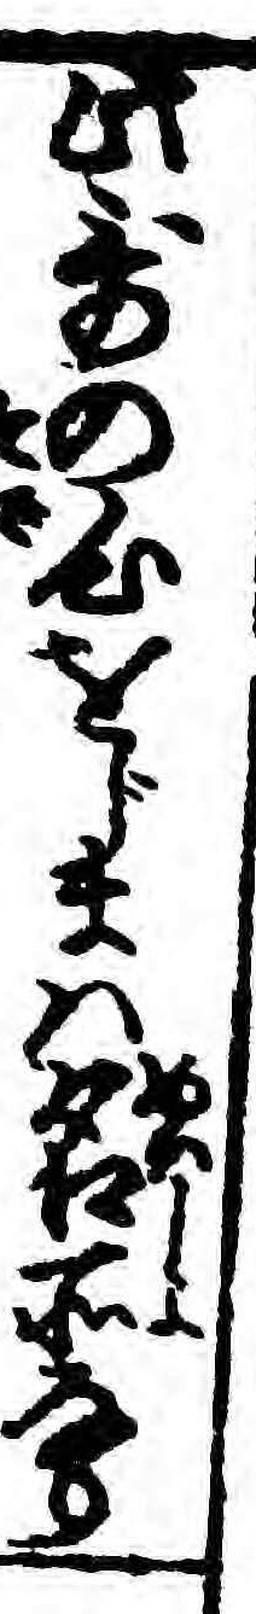此哥の心をじまは名所なり
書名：頭書和歌注譯／壽賀多百人一首小倉錦
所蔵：国文学研究資料館
